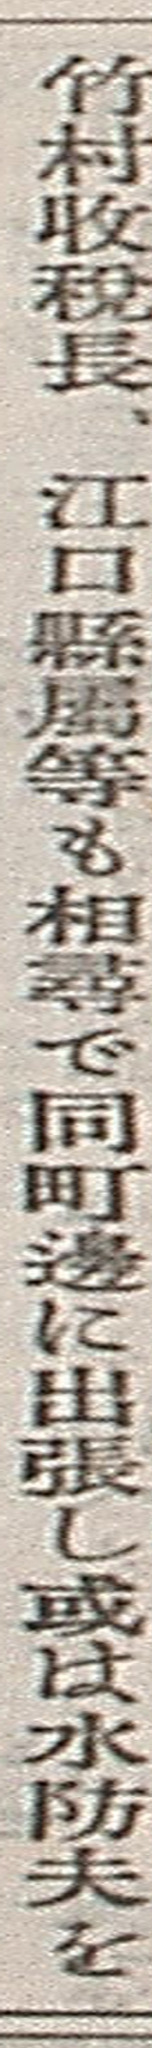竹村収税長、江口県属等も相尋で同町辺に出張し或は水防夫を

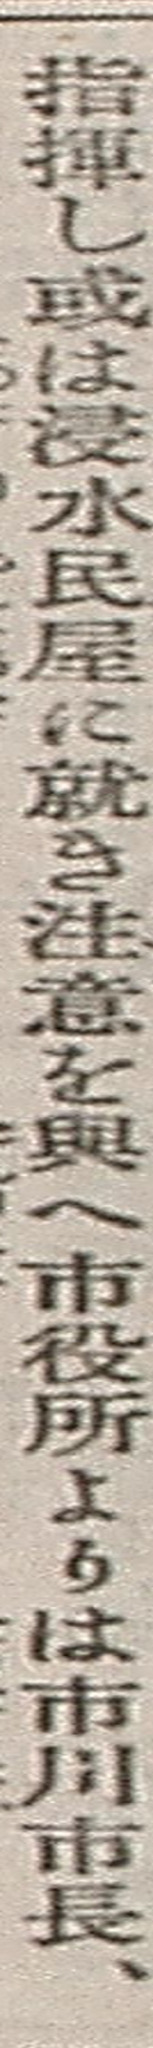指揮し或は浸水民屋に就き注意を与へ市役所よりは市川市長、
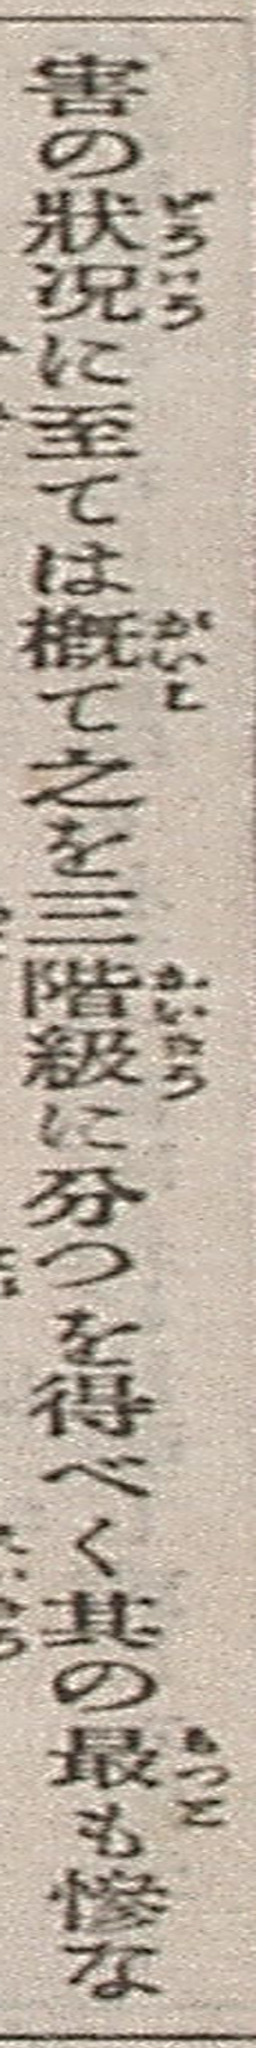害の状況に至ては概て之を三階級に分つを得べく其の最も惨な
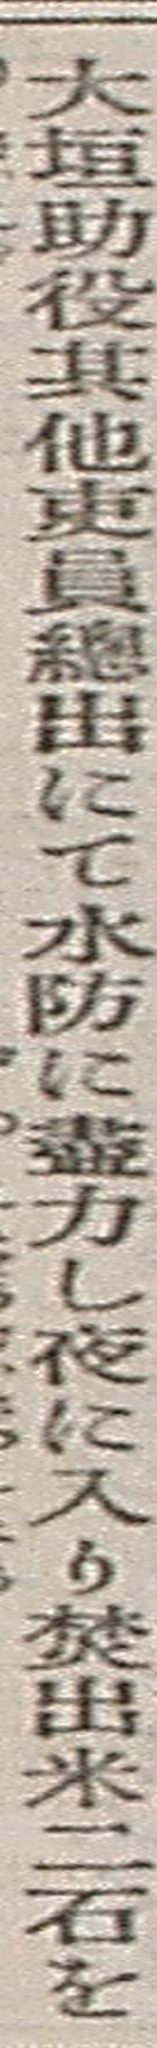大垣助役其他吏員総出にて水防に尽力し夜に入り焚出米二石を
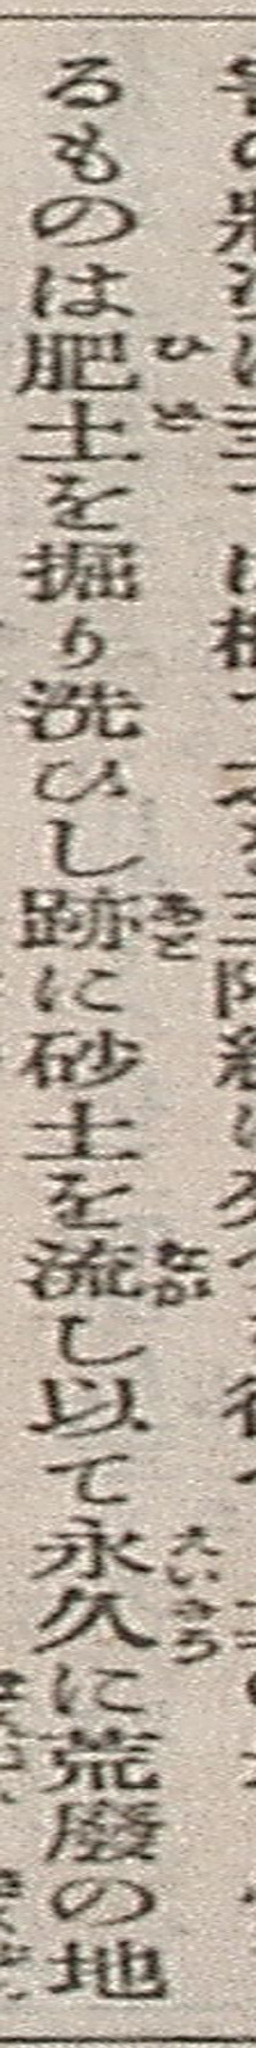るものは肥土を堀り洗ひし跡に砂土を流し以て永久に荒廃の地
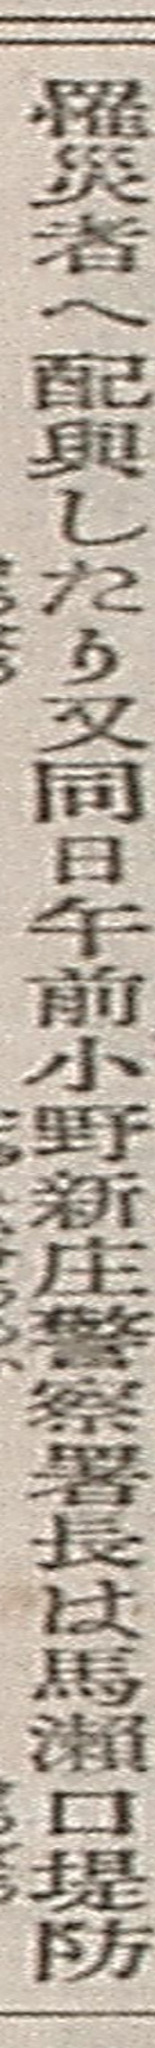罹災者へ配与したり又同日午前小野新庄警察署長は馬瀬口堤防
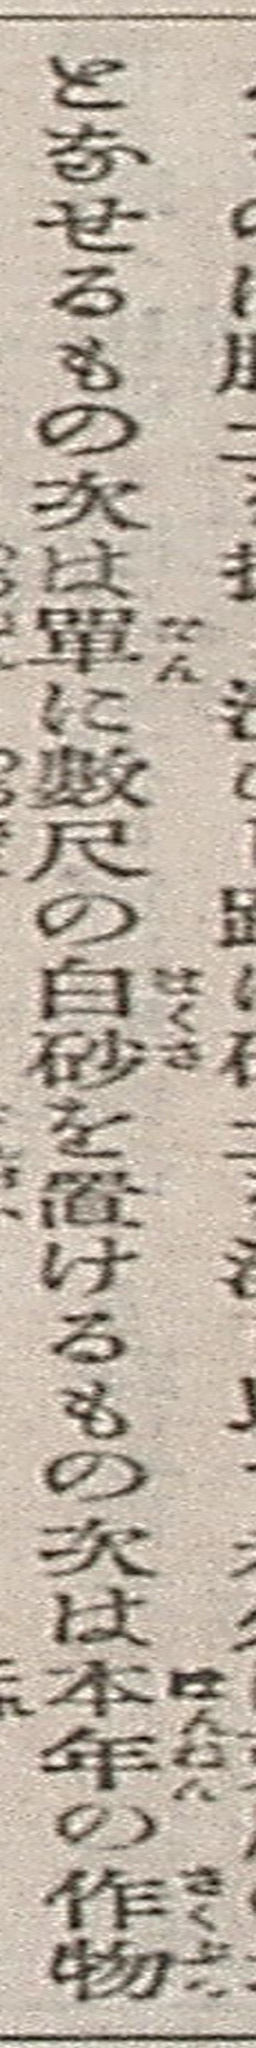となせるもの次は単に数尺の白砂を置けるもの次は本年の作物
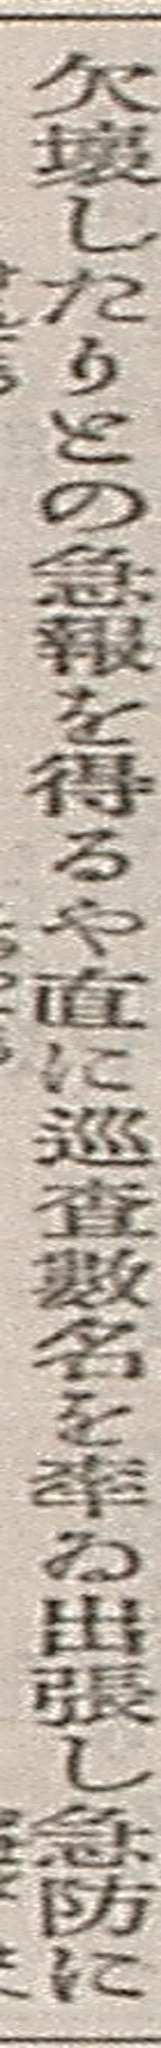欠壊したりとの急報を得るや直に巡査数名を率ゐ出張し急防に
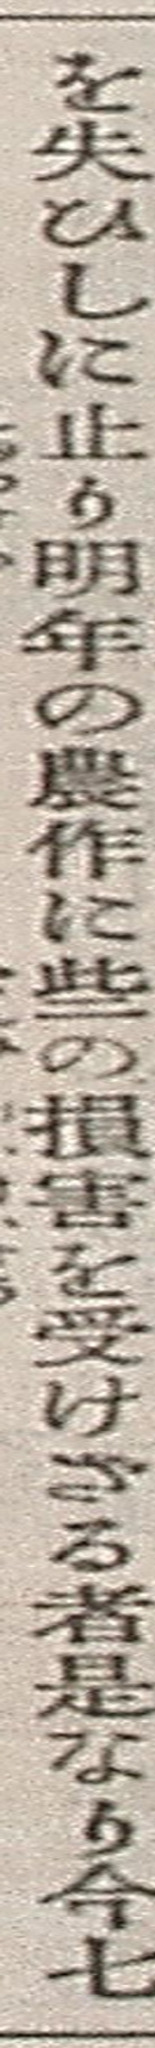を失ひしに止り明年の農作に些の損害を受けざる者是なり今七
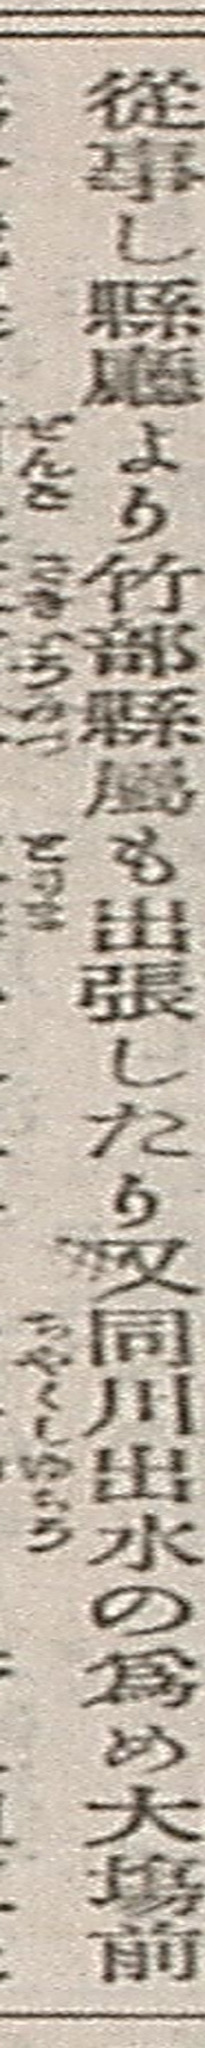従事し県庁より竹部県属も出張したり又同川出水の為め大場前
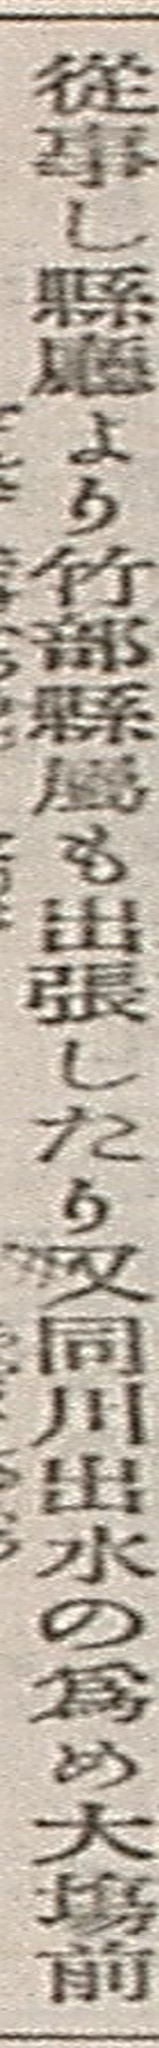従事し県庁より竹部県属も出張したり又同川出水の為め大場前
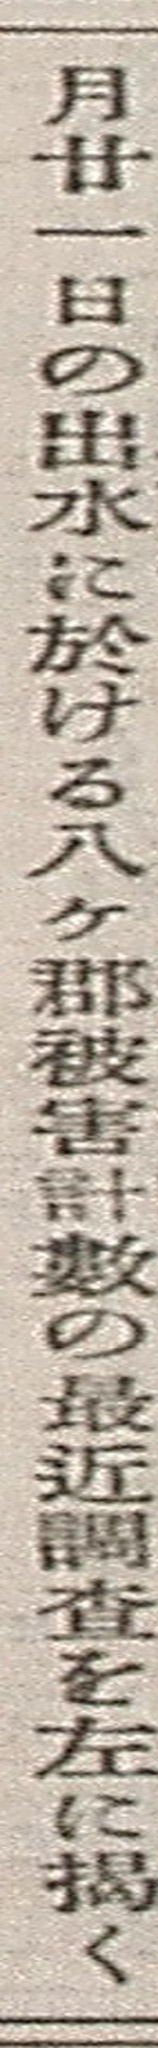月廿一日の出水に於ける八ヶ郡被害計数の最近調査を左に掲く
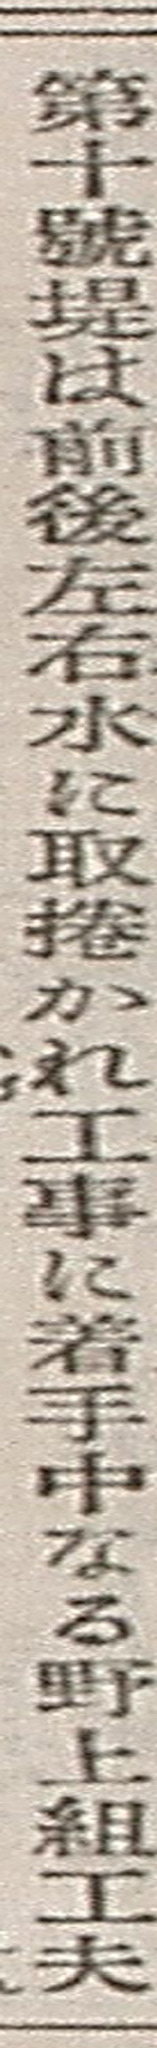第十号堤は前後左右水に取巻かれ工事に着手中なる野上組工夫
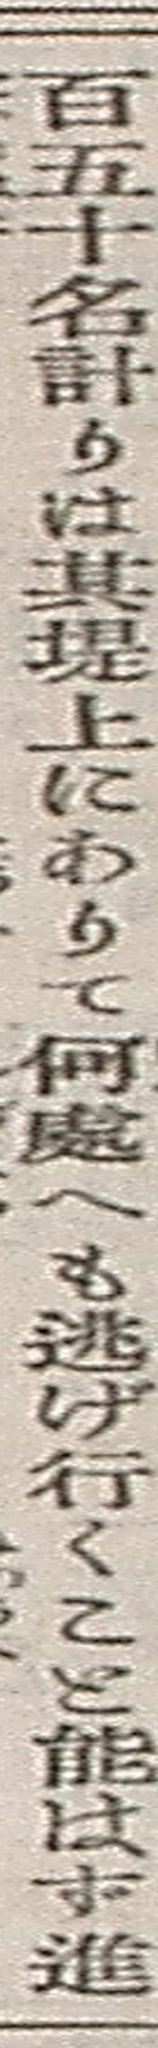百五十名計りは其堤上にありて何処へも逃げ行くこと能はず進
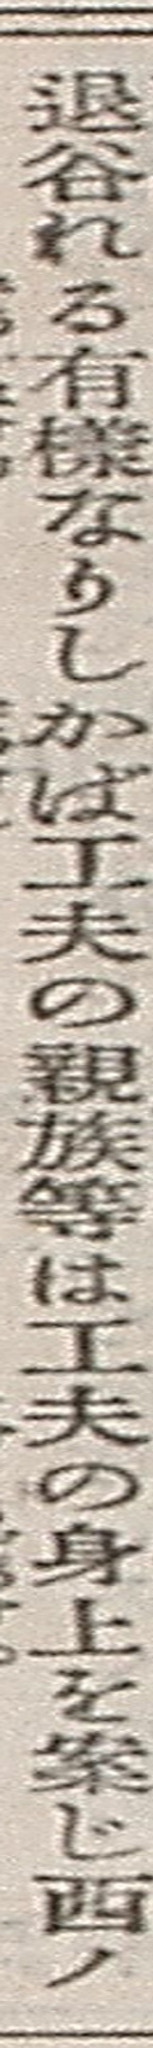退谷れる有様なりしかば工夫の親族等は工夫の身上を案じ西ノ
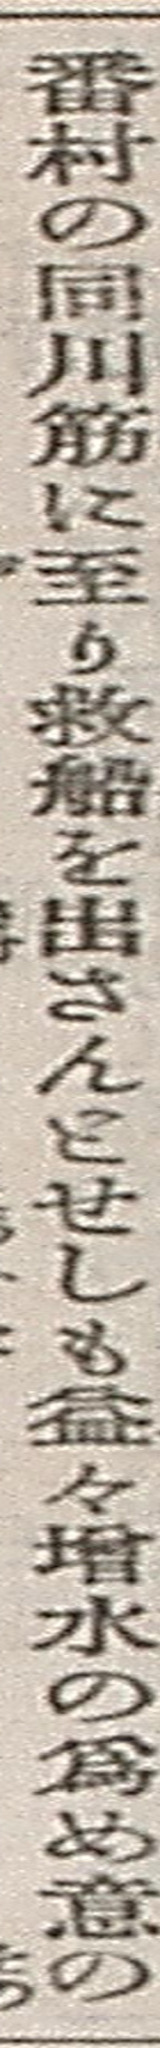番村の同川筋に至り救船を出さんとせしも益々増水の為め意の
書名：風俗畫報臨時増刊第百二十八號　洪水被害録（下）
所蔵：東京大学地震研究所図書室 Earthquake Research Institute Library, The University of Tokyo, JAPAN
